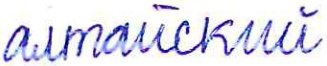алтайский
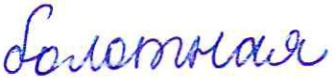болотная
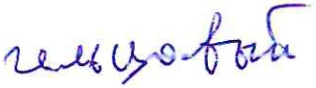гольцовый
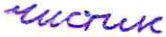чистик
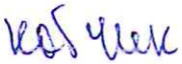кобчик
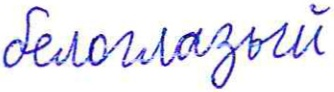белоглазый
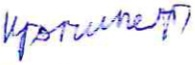кроншпетт
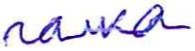галка
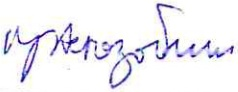краснозобик
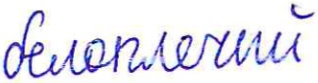белоплечий
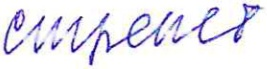стрепет
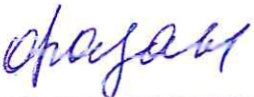фазан
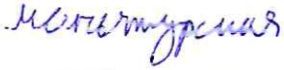маньчжурская
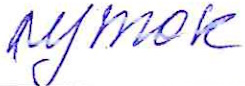луток
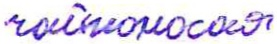чайконосая
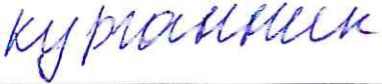курганник
